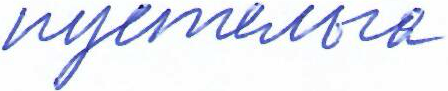пустельга
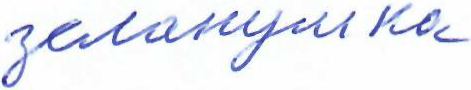зеланушка
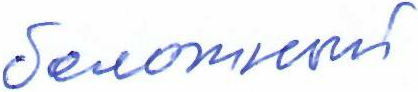болотный
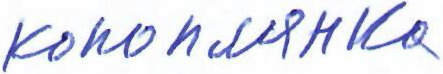коноплянка
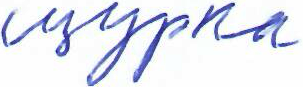щурка
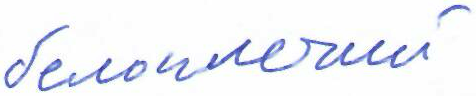белоплечий
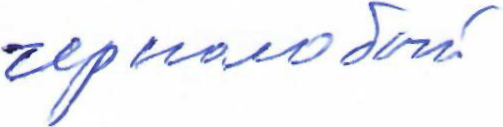чернолобый
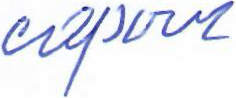сарыч
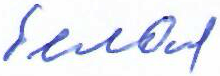белая
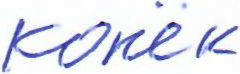конёк
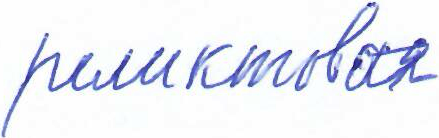реликтовая
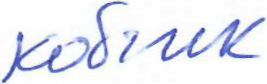кобчик
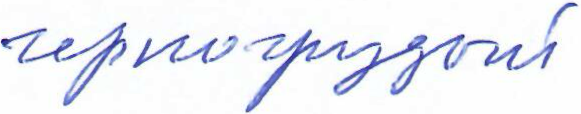черногрудый
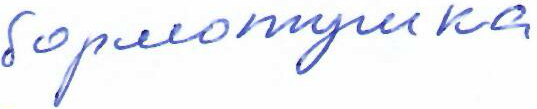бормотушка
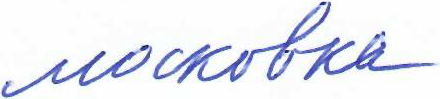московка
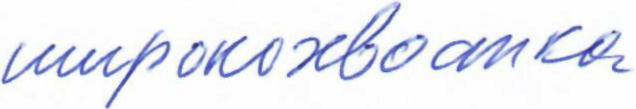широкохвостка
